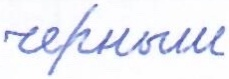черныш
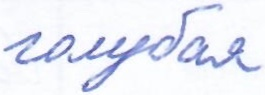голубая
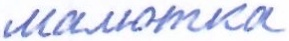малютка
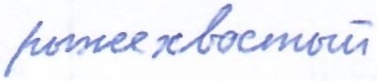рыжехвостый
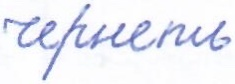чернеть
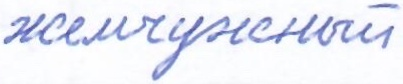жемчужный
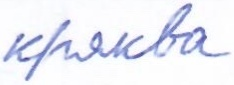кряква
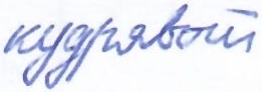кудрявый
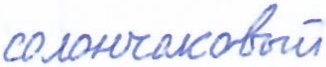солончаковый
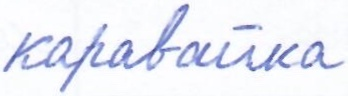каравайка
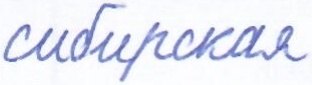сибирская
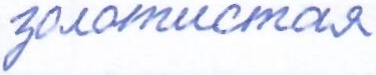золотистая
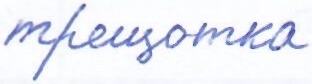трещотка
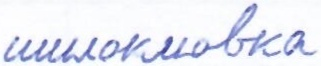шилоклювка
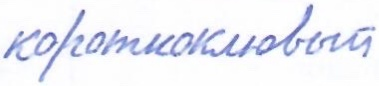короткоклювый
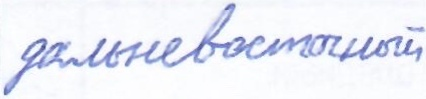дальневосточный
